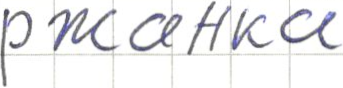ржанка
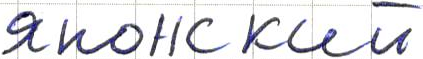японский
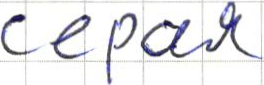серая
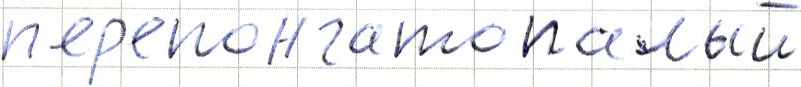перепончатопалый
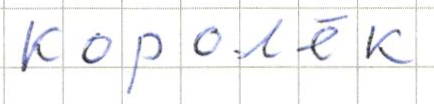королёк
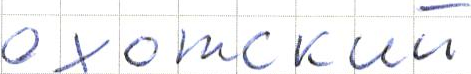охотский
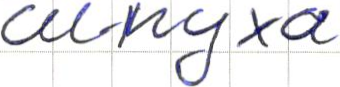сипуха
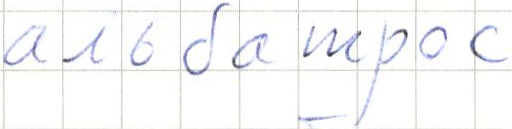альбатрос
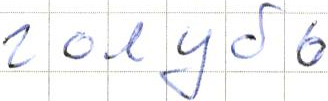голубь
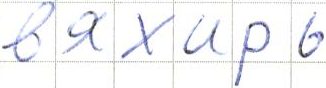вяхирь
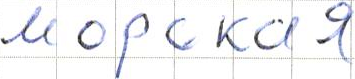морская
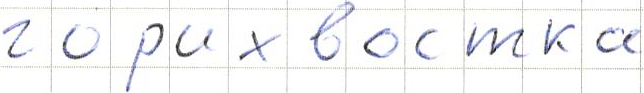горихвостка
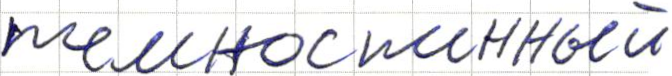темноспинный
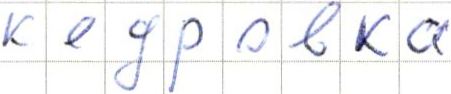кедровка
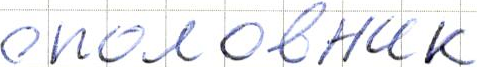ополовник
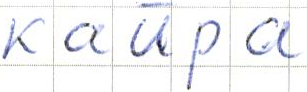кайра
